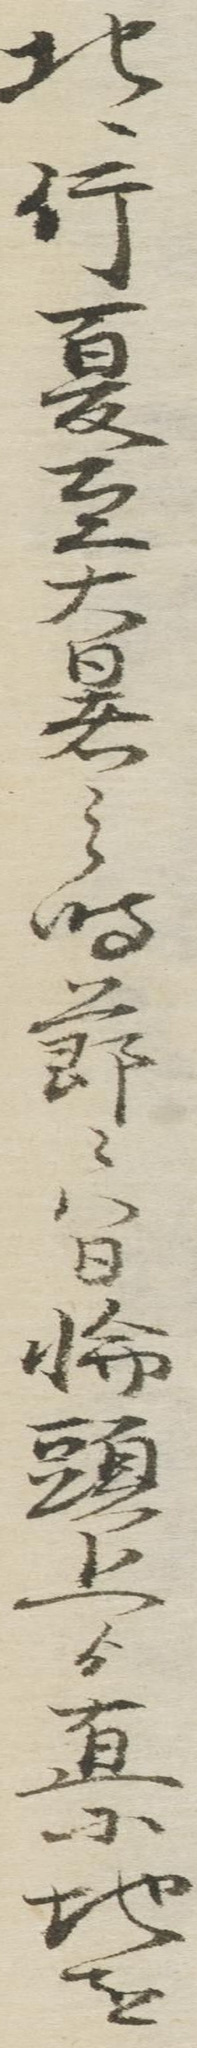北へ行夏至大暑之時節ニハ日輪頭上ゟ直に地を

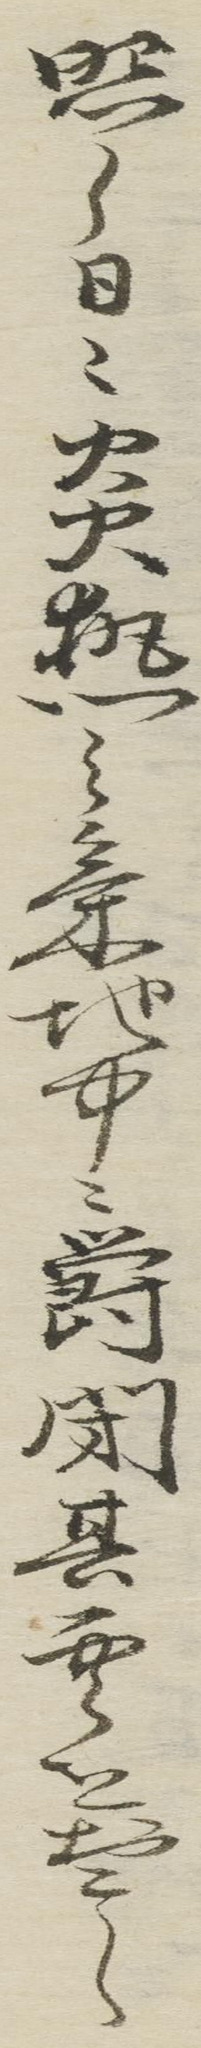照し日々炎熱之気地中ニ爵閉其空をおこし
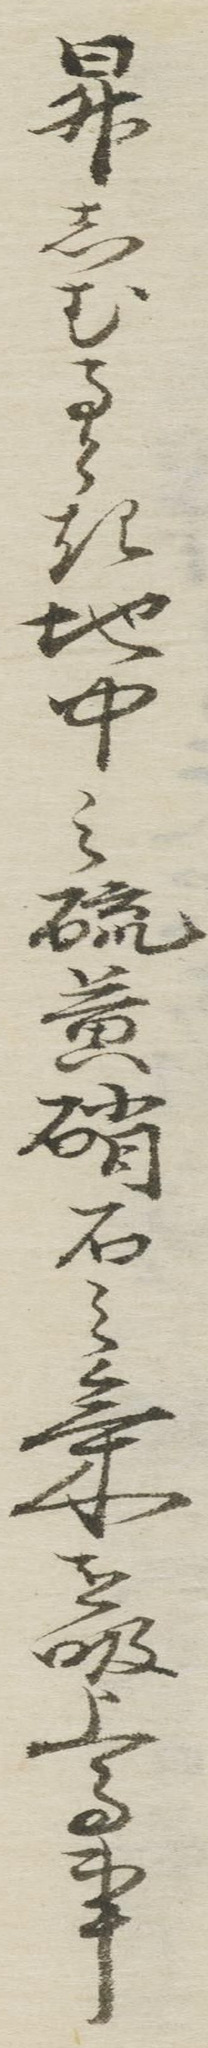昇しむるとき地中之硫黄硝石之気を吸上る事
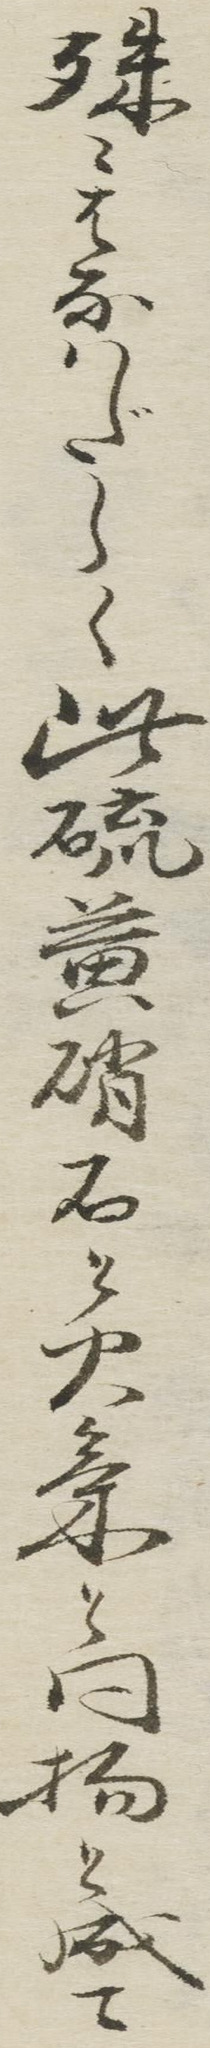殊ニはなはだしく此硫黄硝石と火気と同物と成て
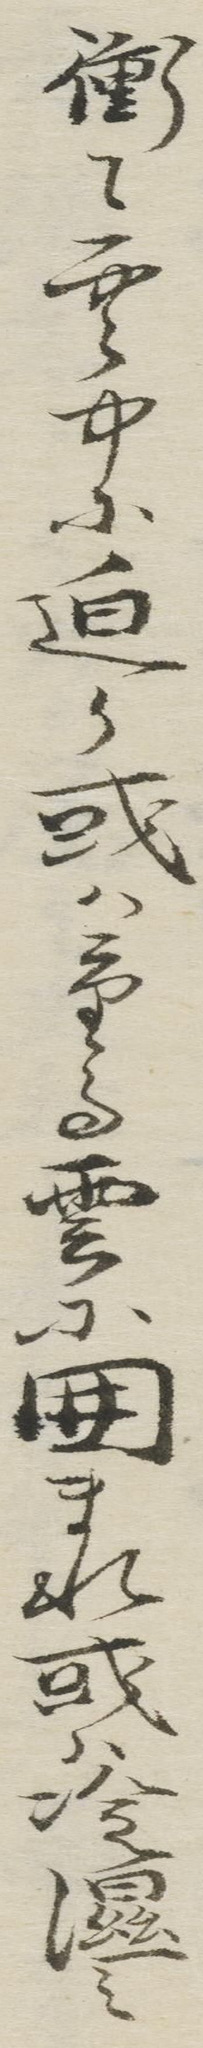衝て空中に迫り或ハ重る雲に囲まれ或ハ冷疾湿之
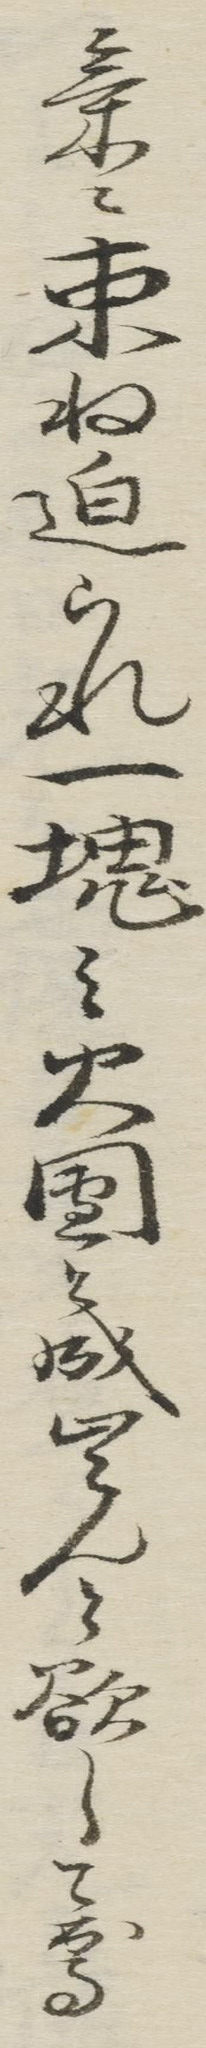気ニ束ね迫られ一塊之火団と成り出んと欲して驚
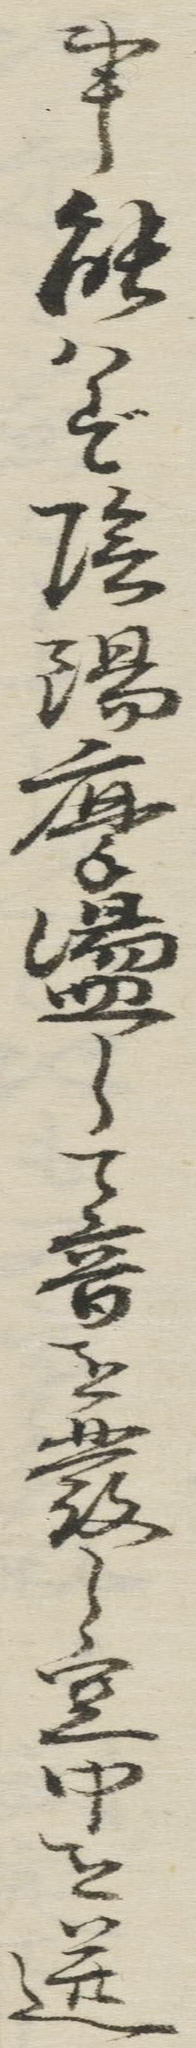事能ハず陰陽摩盪して音を発し空中を迸
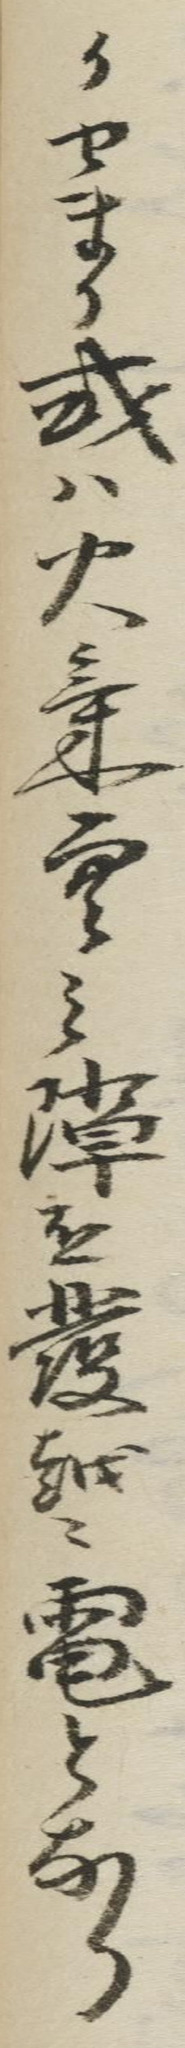りセまり或ハ火気空之隙を叢越ニ電となり
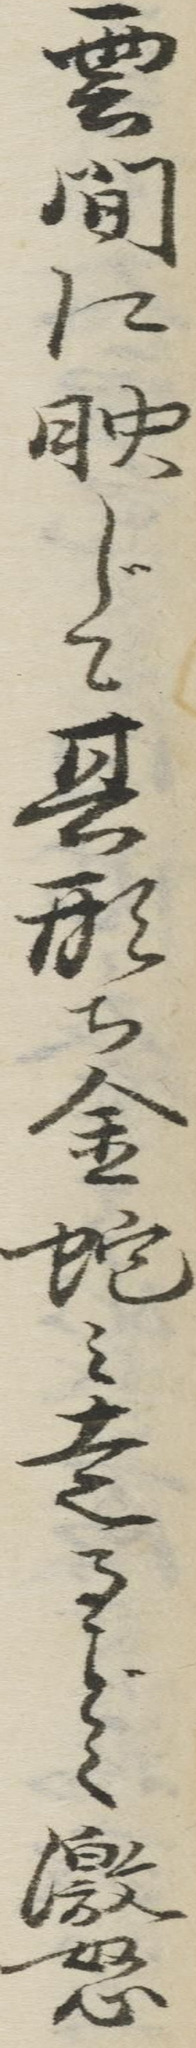雲間に映じて其形ち金蛇之走るごとく激怒
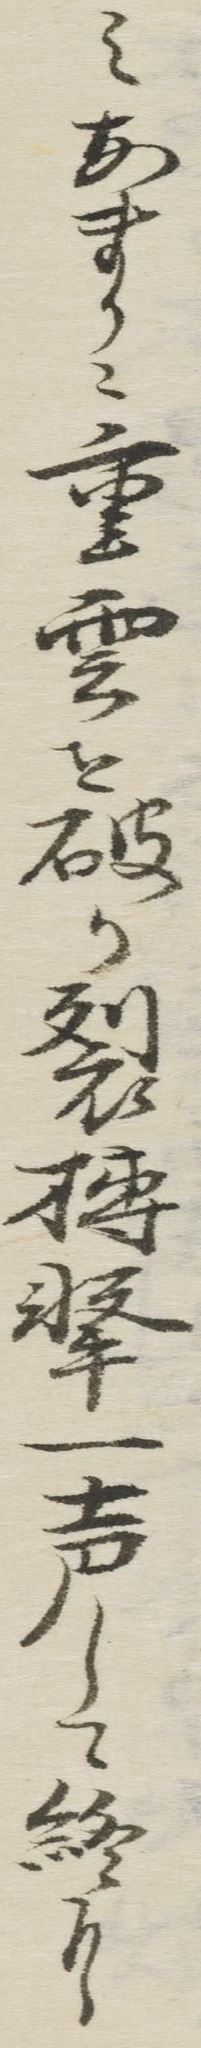之あまりニ重雲を破り裂榑撃一声して終に
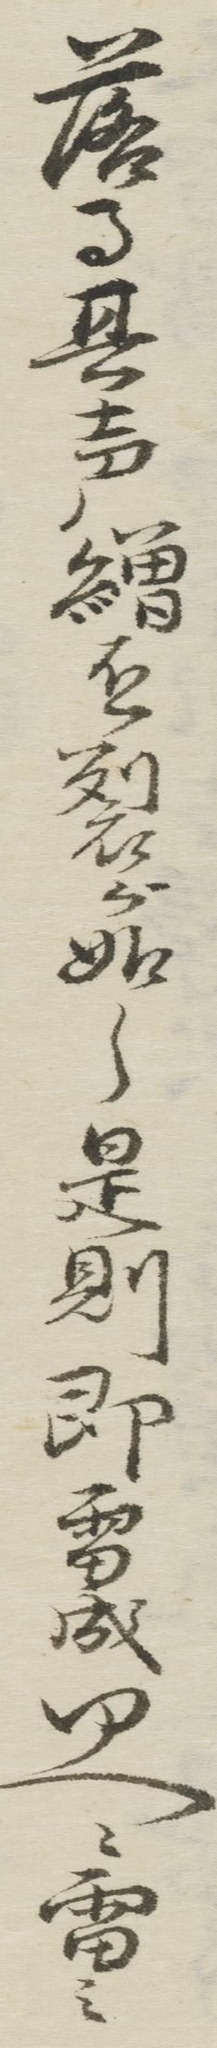落る其声繒を裂が如し是則即雷成ゆへに雷之
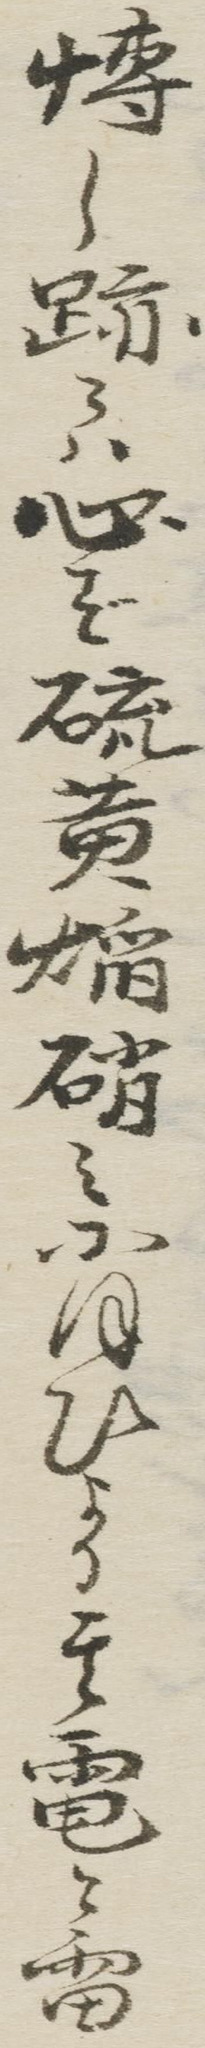轉し跡ニハ必ず硫黄焔硝之にほひより其電と雷
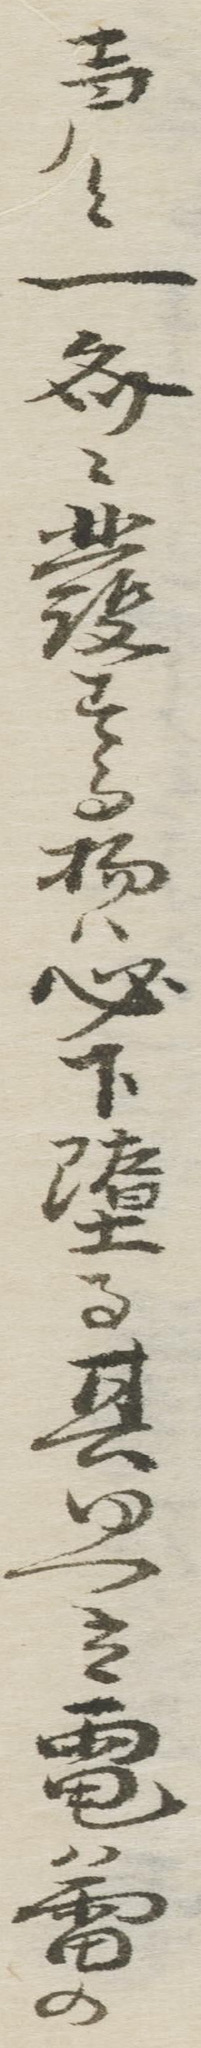声と一斉ニ発する物ハ必下堕る其ゆへは電ハ雷の
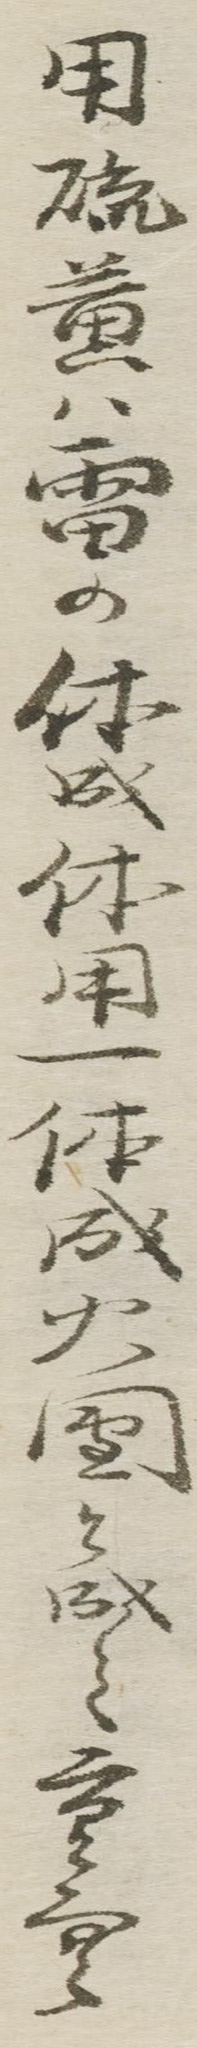用硫黄ハ雷ノ体成体用一体成火団と成て重空
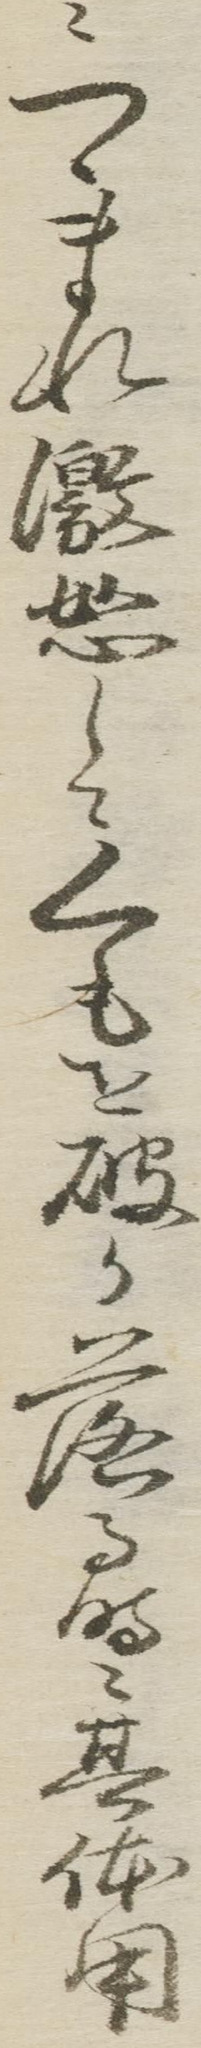ニつゝまれ激怒してくもを破り落る時ニ其体用

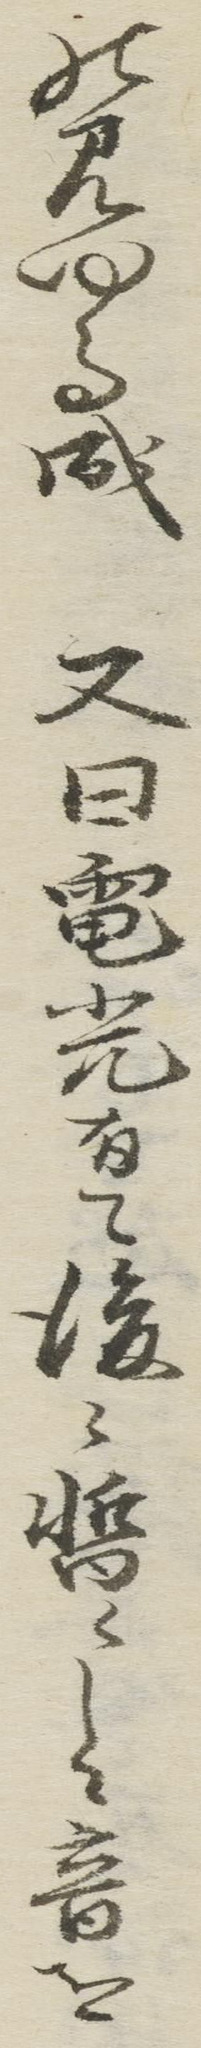の見ゆる成又曰電光有て後ニ暫くして音を
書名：諸国大地震大津波一代記
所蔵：東京大学地震研究所図書室 Earthquake Research Institute Library, The University of Tokyo, JAPAN
